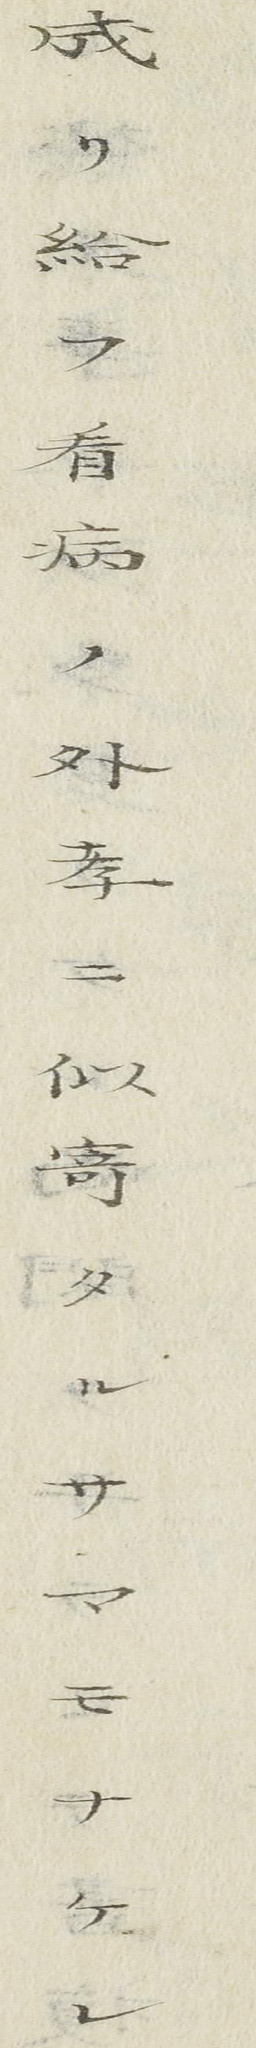成リ給フ看病ノ外孝ニ似寄タルサマモナケレ
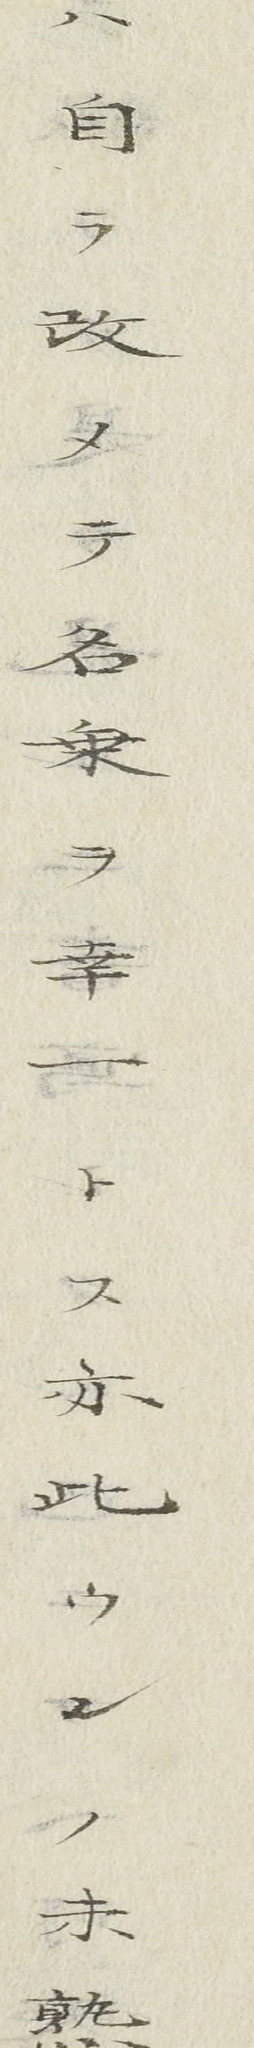ハ自ラ改メテ名乗ヲ幸一トス亦此ウンノ未熟
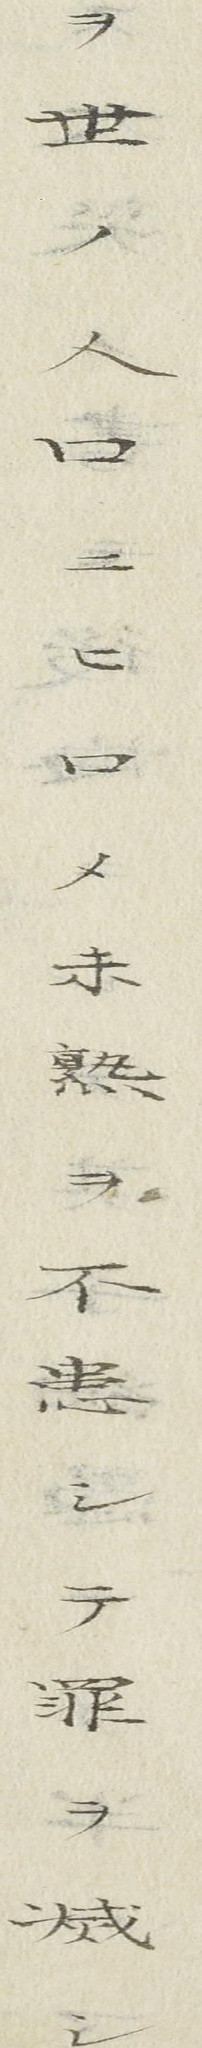ヲ世ノ人口ニヒロメ未熟ヲ不患シテ罪ヲ減シ
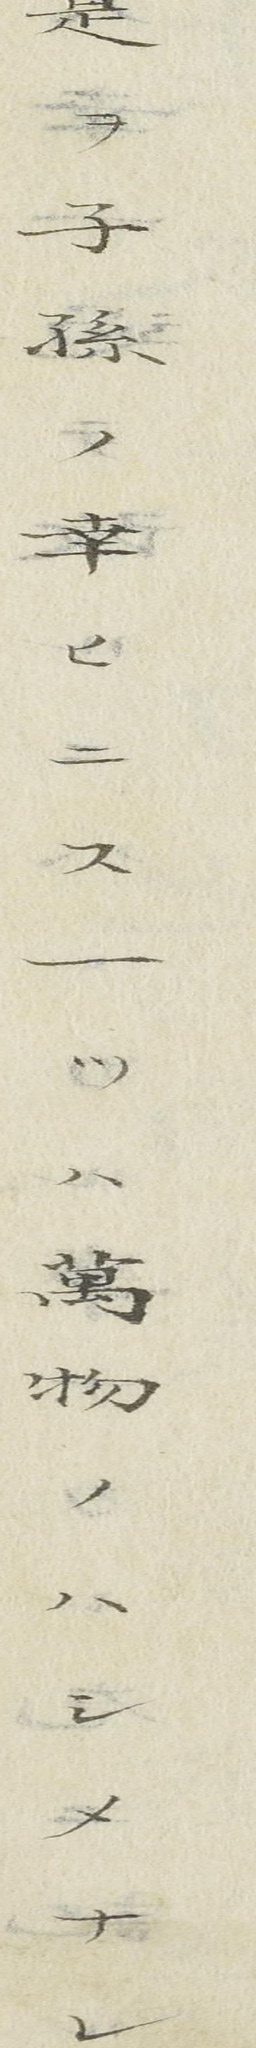是ヲ子孫ノ幸ヒニス一ツハ万物ノハシメナレ

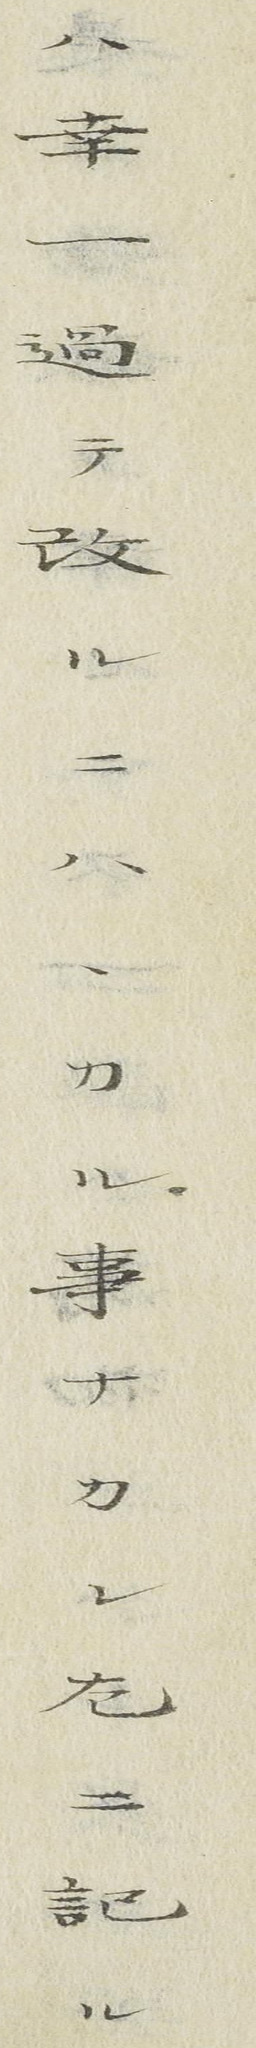ハ幸一過テ改ルニハヽカル事ナカレ左ニ記ル
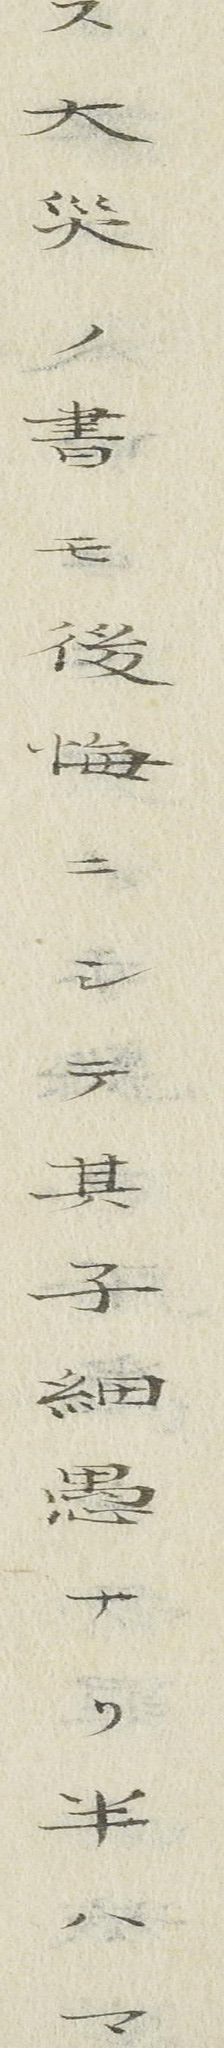ス大災ノ書モ後悔ニシテ其子細愚ナリ半ハマ
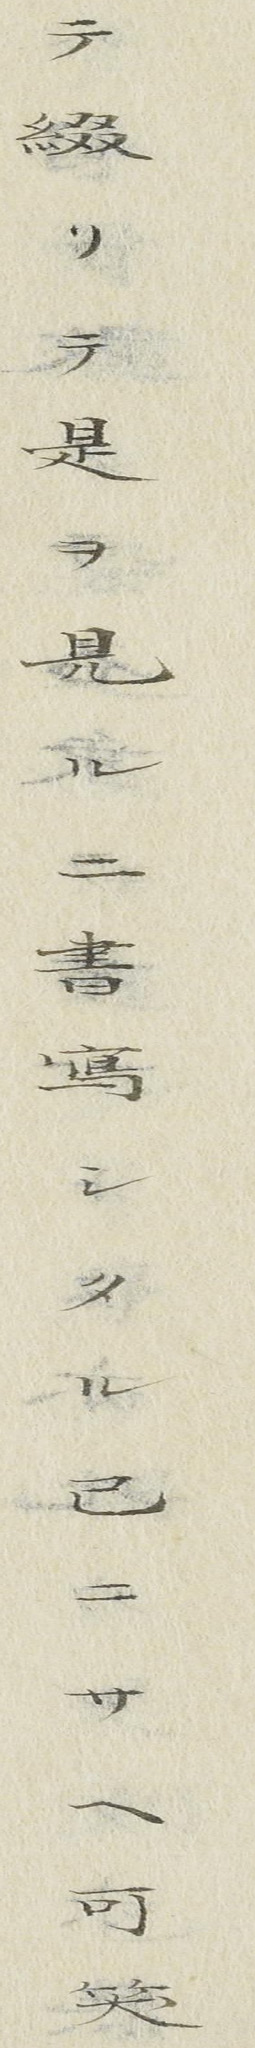テ綴リテ是ヲ見ルニ書写シタル己ニサヘ可笑
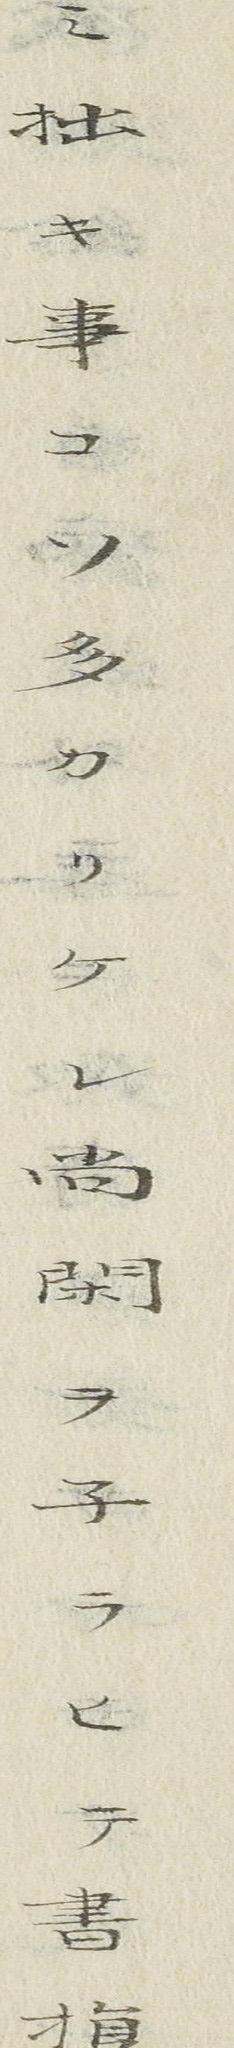ミ拙キ事コソ多カリケレ尚閑ヲ子ラヒテ書損
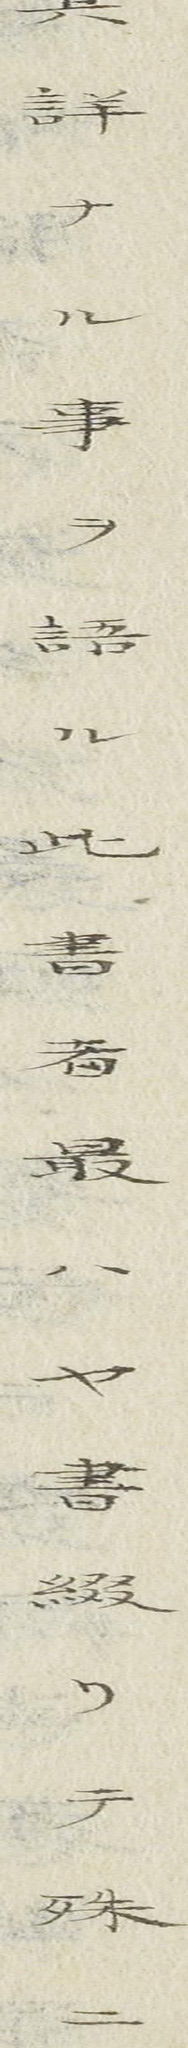其詳ナル事ヲ語ル此書者最ハヤ書綴リテ殊ニ
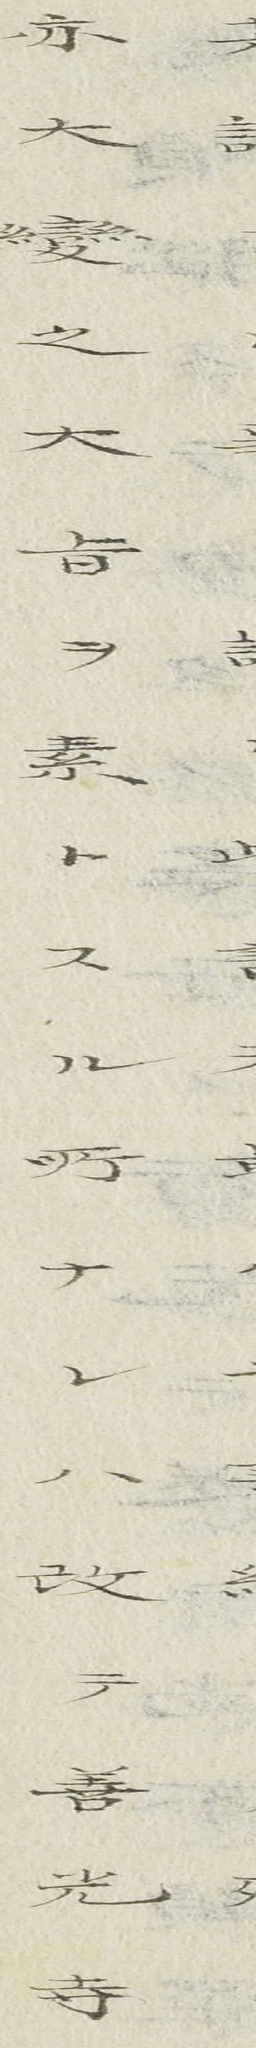亦大変之大旨ヲ素トスル所ナレハ改テ善光寺
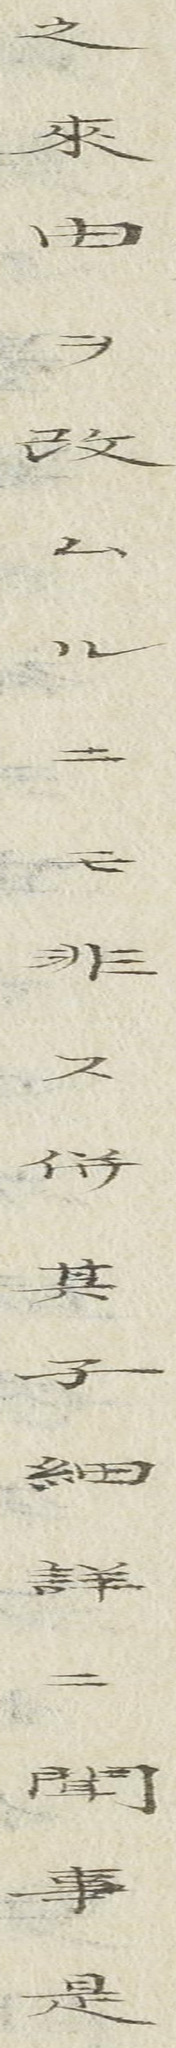之来由ヲ改ムルニモ非ス併其子細詳ニ聞事是
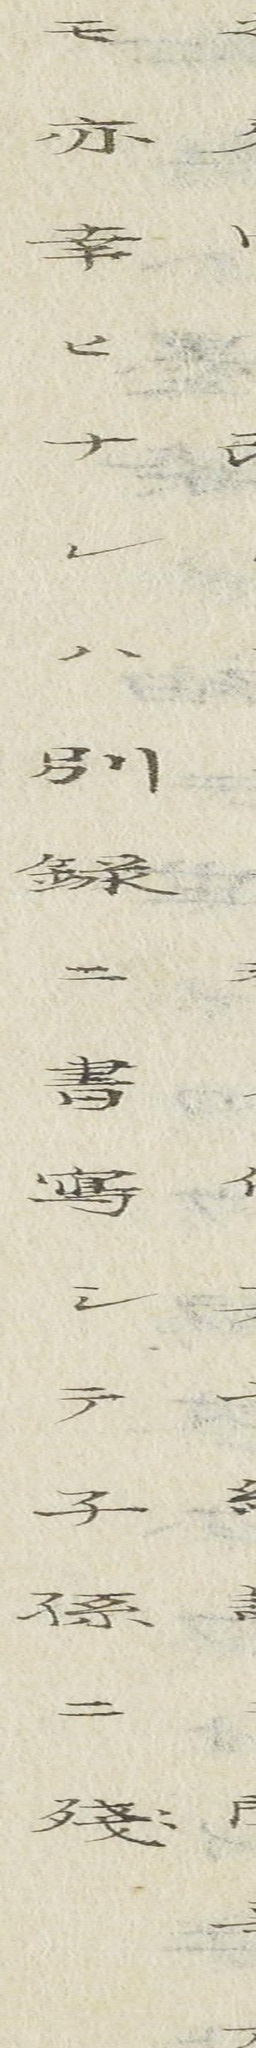モ亦幸ヒナレハ別録ニ書写シテ子孫ニ残
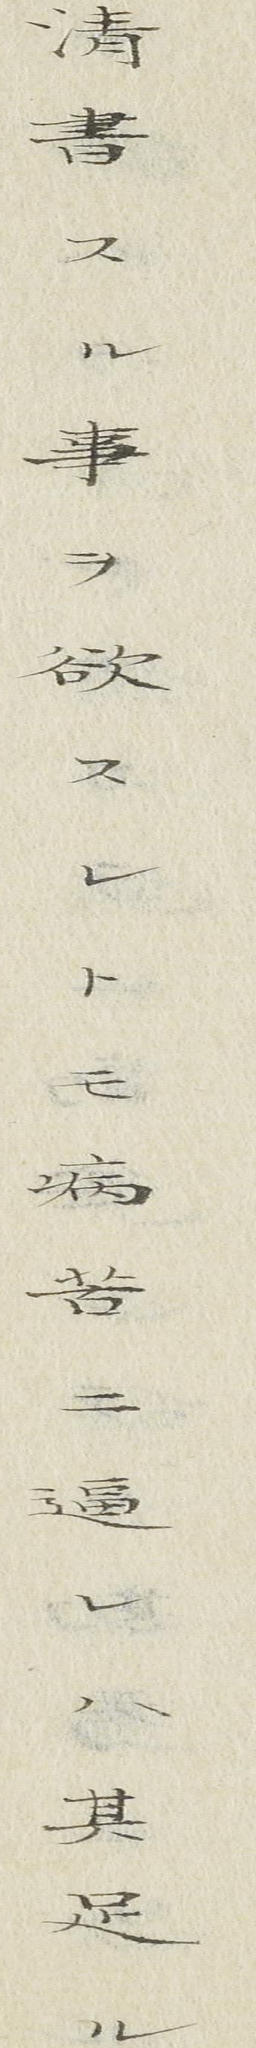清書スル事ヲ欲スレトモ病苦ニ逼レハ其足ル
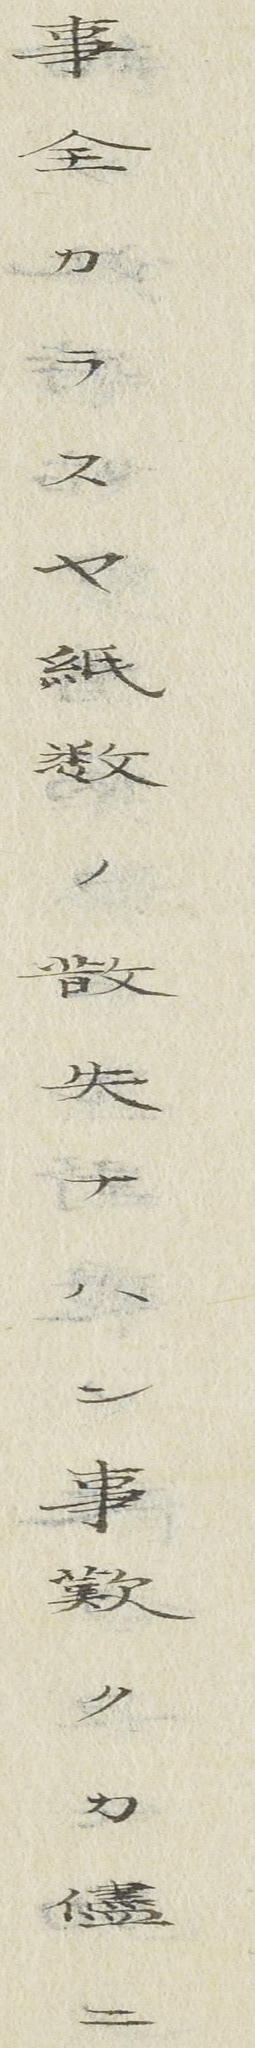事全カラスヤ紙数ノ散失ナハン事歎クカ儘ニ
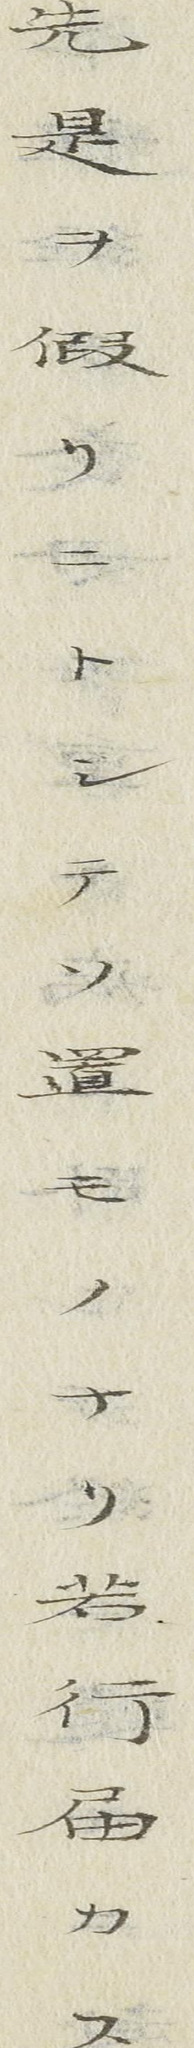先是ヲ仮リニトシテソ置モノナリ若行届カス
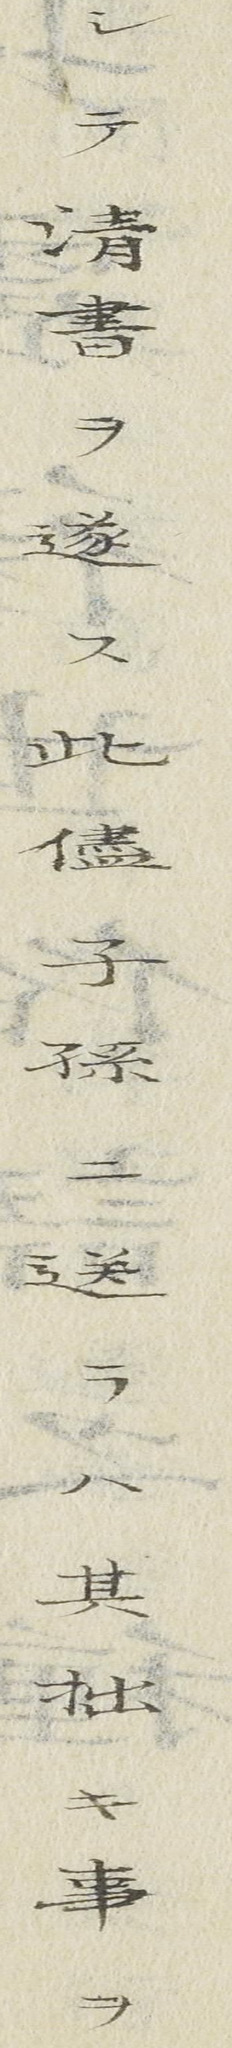シテ清書ヲ遂ス此儘子孫ニ送ラハ其拙キ事ヲ
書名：地災撮要　地震之部　巻ノ二
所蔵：東京大学地震研究所図書室 Earthquake Research Institute Library, The University of Tokyo, JAPAN
